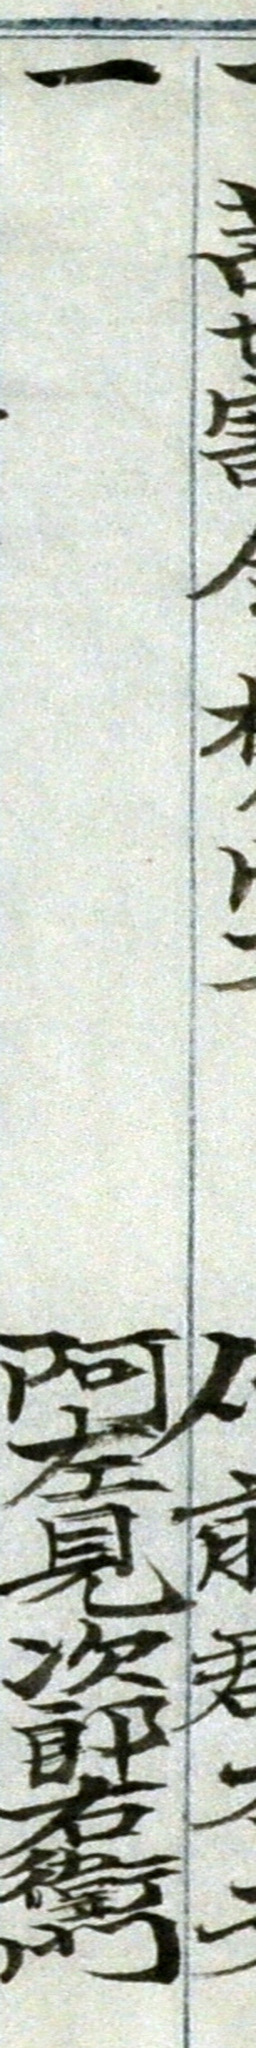一阿左見次郎右衛門
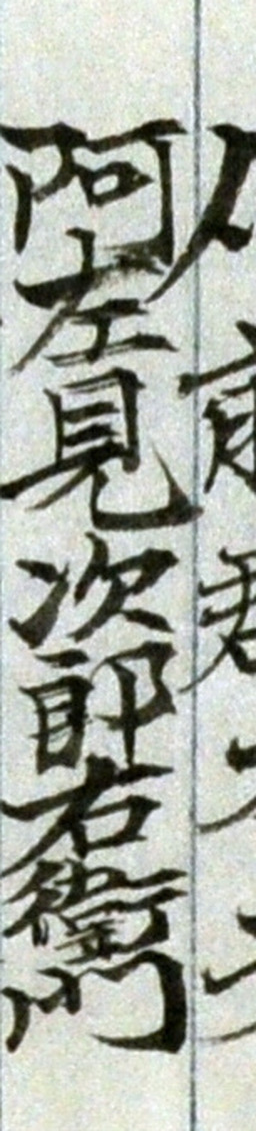一阿左見次郎右衛門
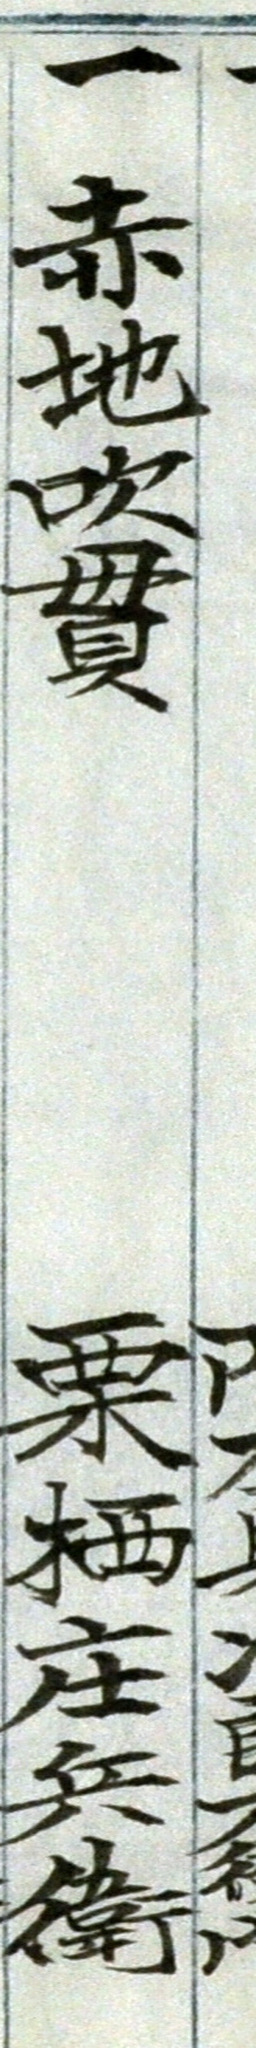一赤地吹貫栗栖庄兵衛
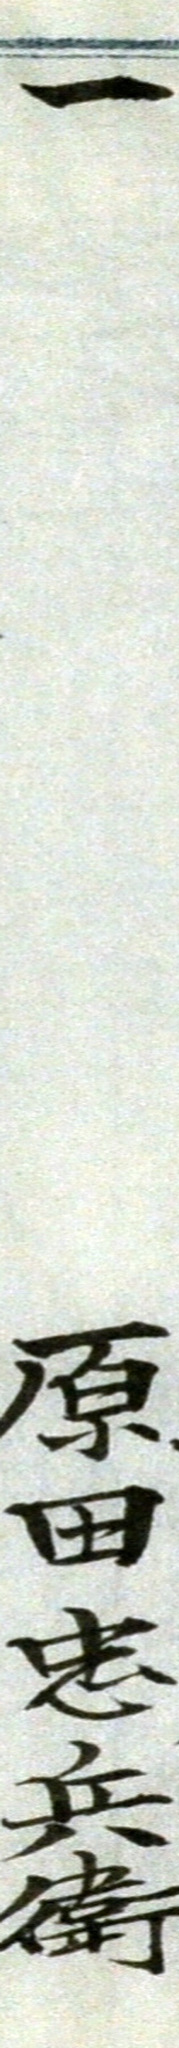一原田忠兵衛
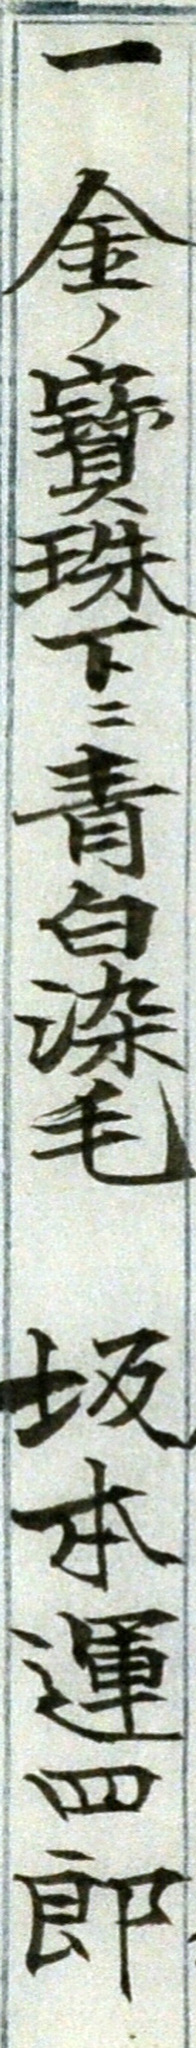一金ノ宝珠下ニ青白染毛坂本運四郎
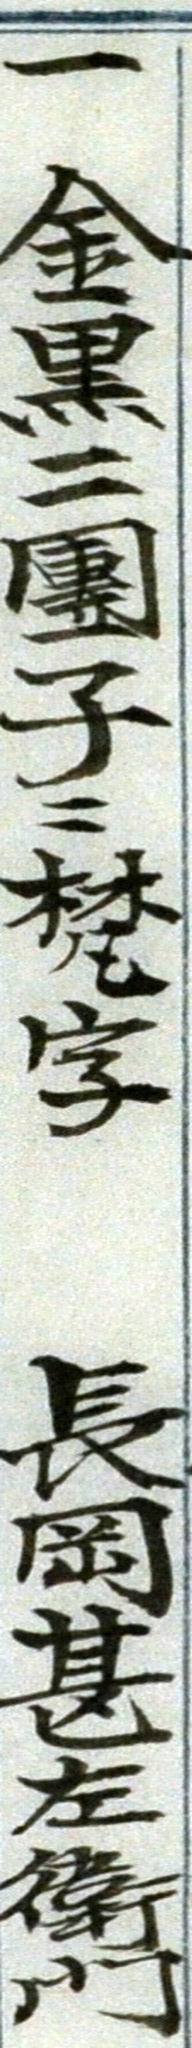一金黒ニ団子ニ梵字長岡甚左衛門
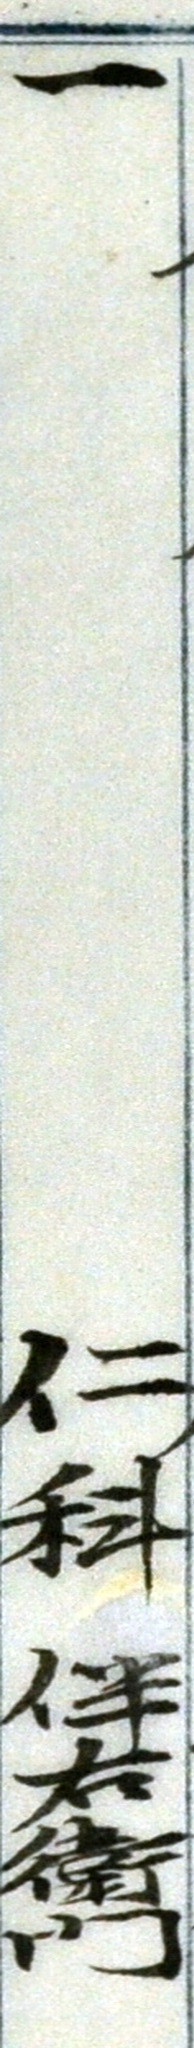一仁科伴右衛門
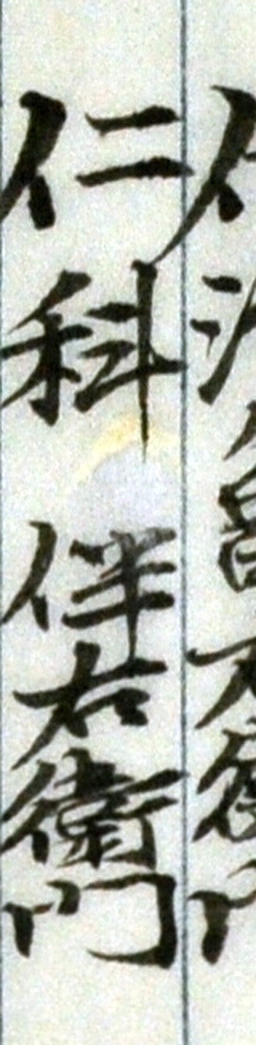一仁科伴右衛門
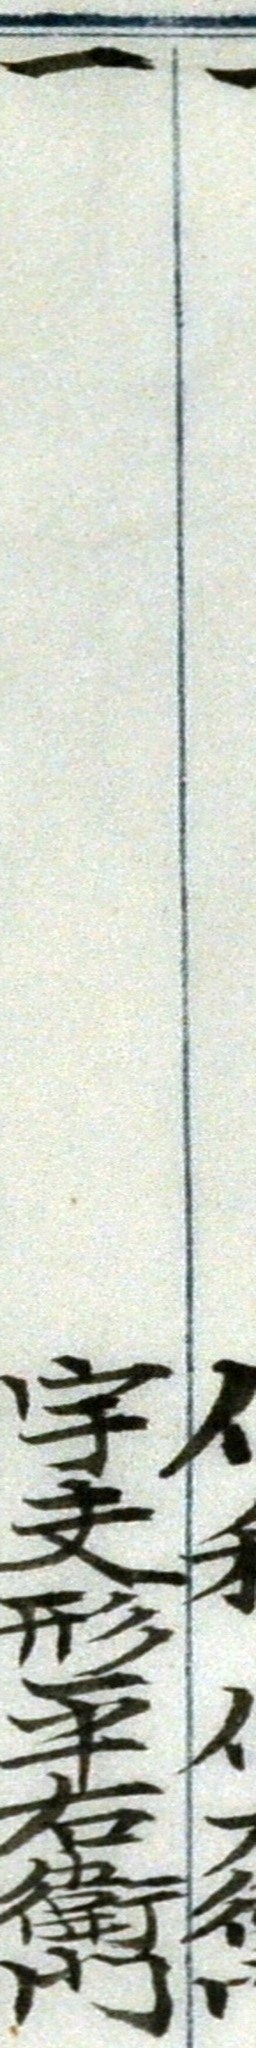一宇夫形平右衛門
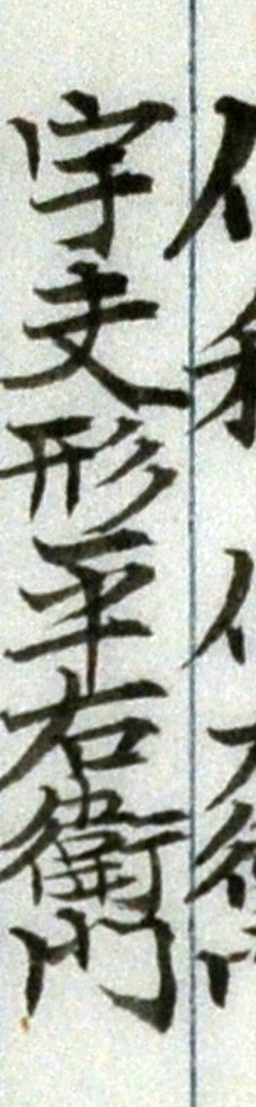一宇夫形平右衛門

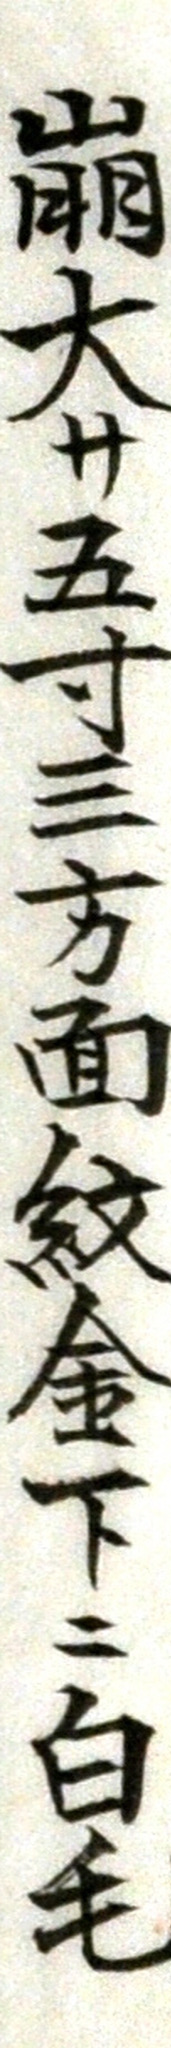崩大サ五寸三方面紋金下ニ白毛
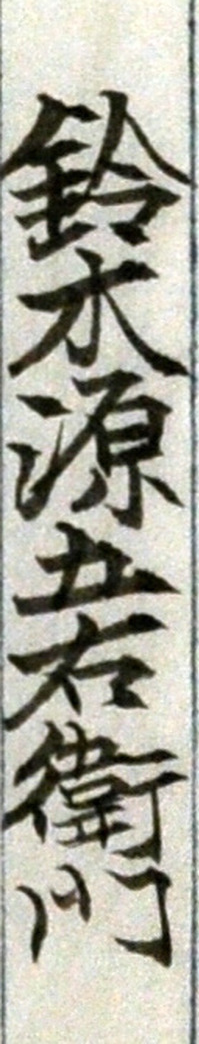一鈴木源五右衛門
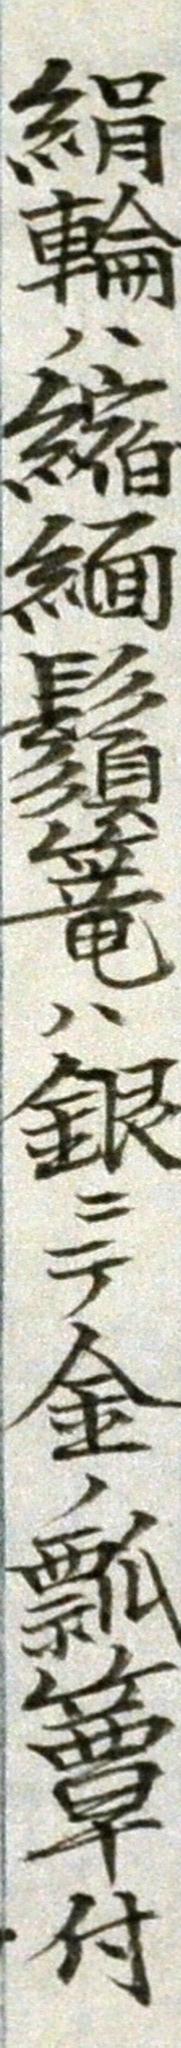絹輪ㇵ縮緬鬚籠ㇵ銀ニテ金ノ瓢箪付
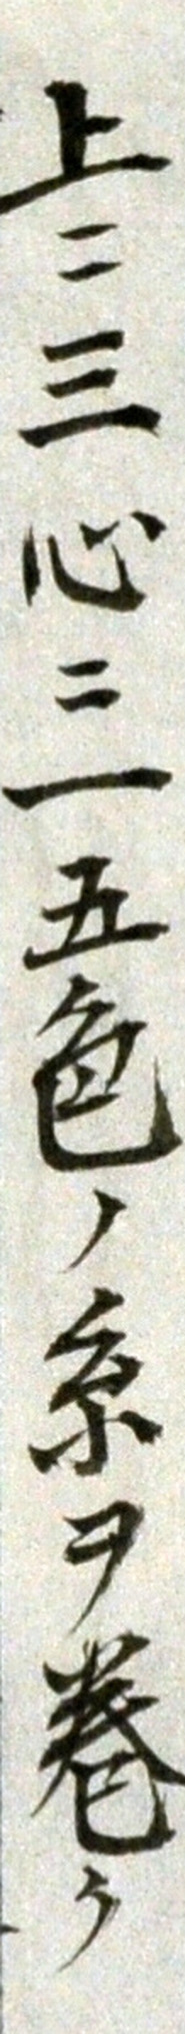上ニ三心ニ一五色ノ糸ヲ巻ク
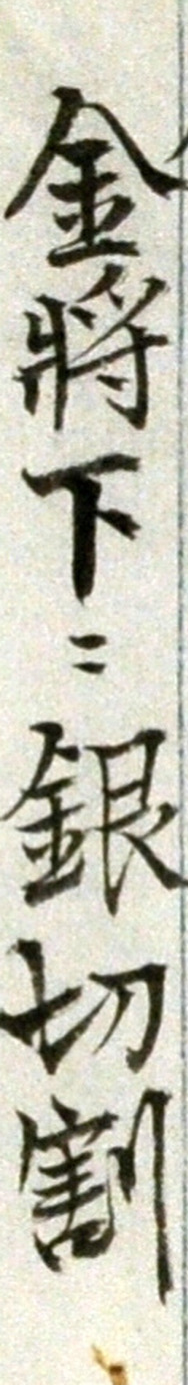金将下ニ銀切割
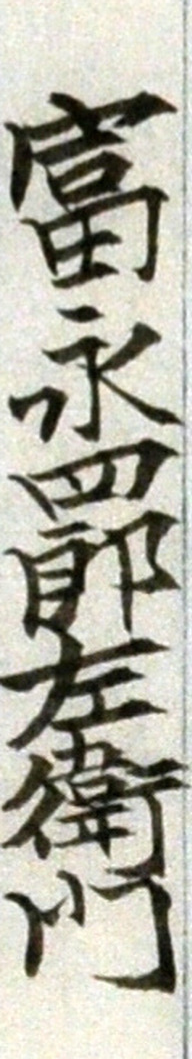一富永四郎左衛門
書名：江戸高遠出シ品附之写
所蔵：伊那市立高遠町図書館・合同会社AMANE
